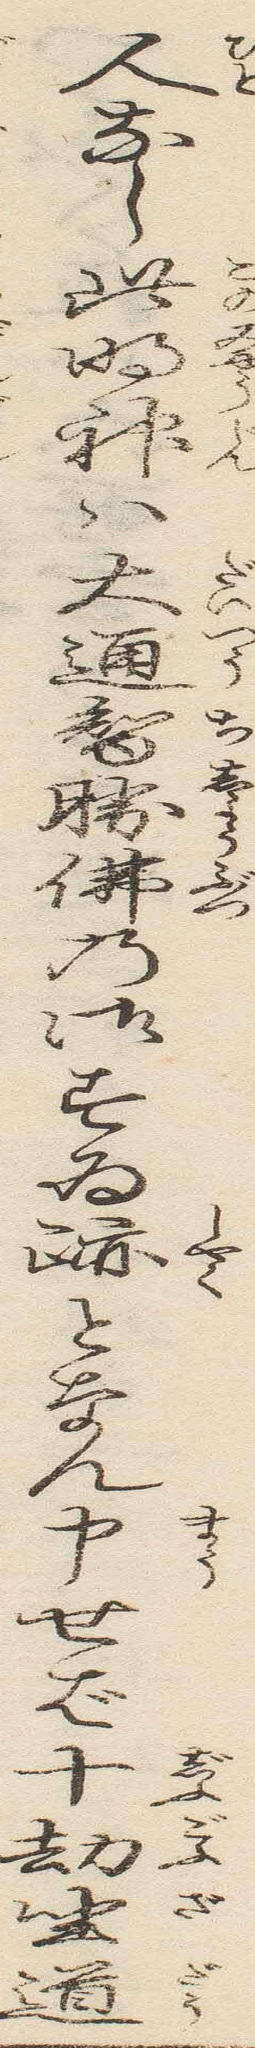人なし此明神は大通智勝佛の御すゐ跡となん申せば十劫坐道
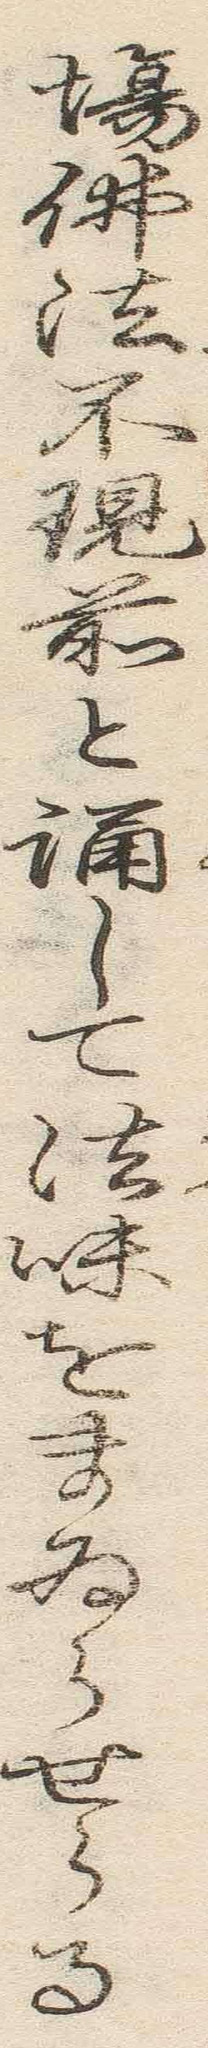塲佛法不現前と誦して法味をまゐらせらる
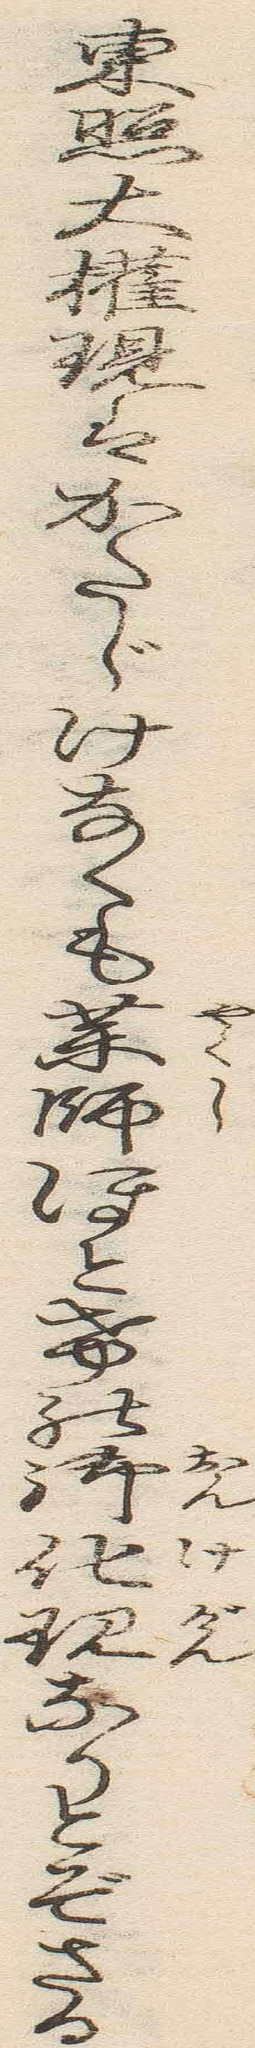東照大權現はかたじけなくも薬師ほとけの御化現なりとぞさる
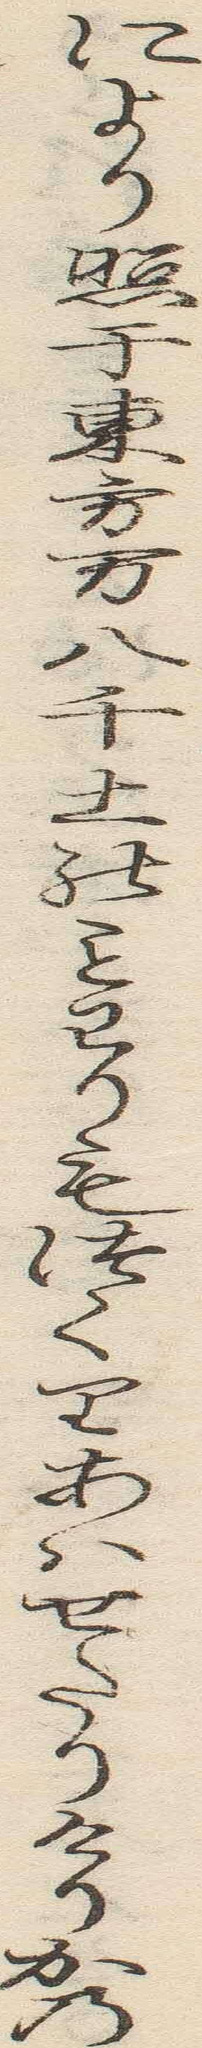により照于東方万八千土のことわりもつくりあはせたりけりかの
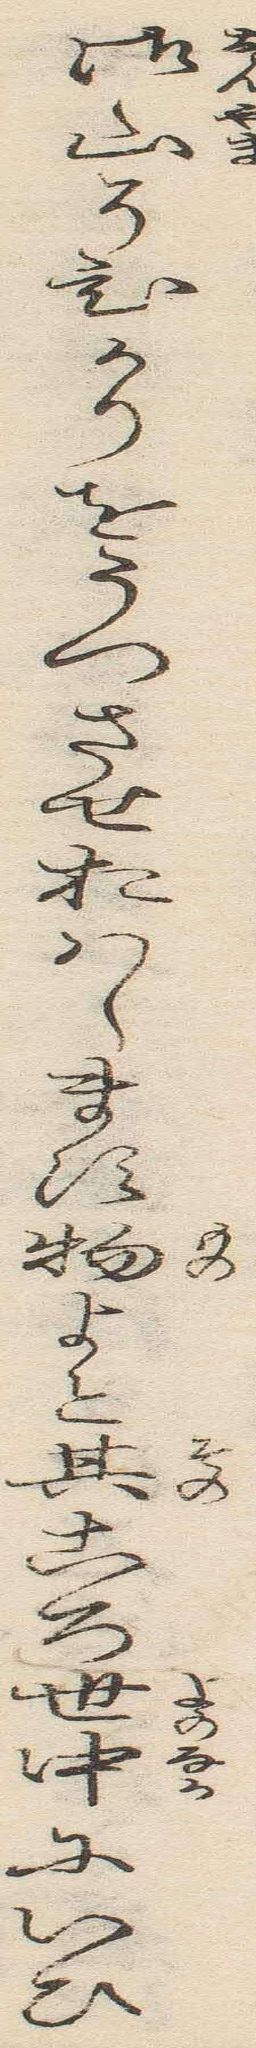御山にひかりをうつさせおはします物よと其ころ世中にいひ
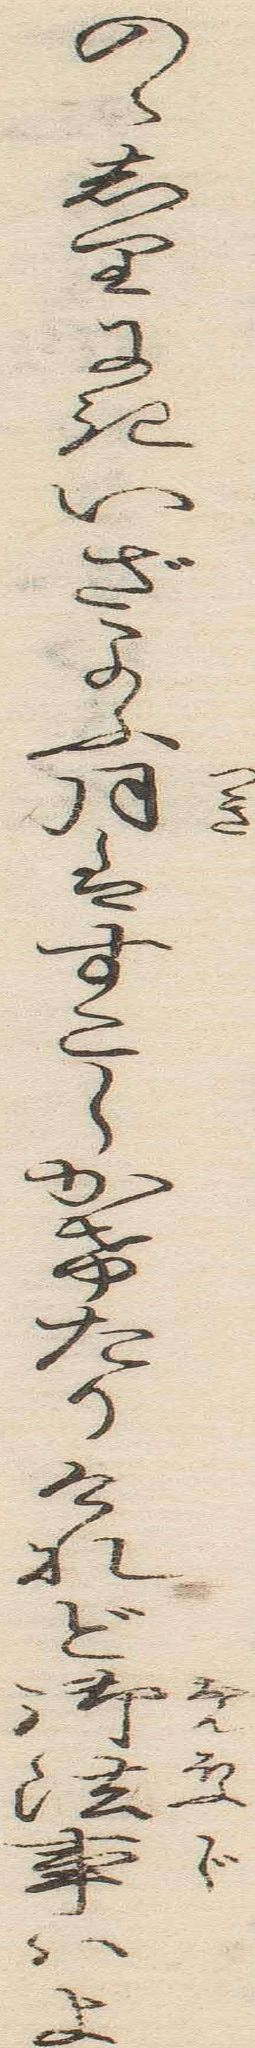のゝしりにきいざよふ月はすこしかけたりけれど御法事はよ
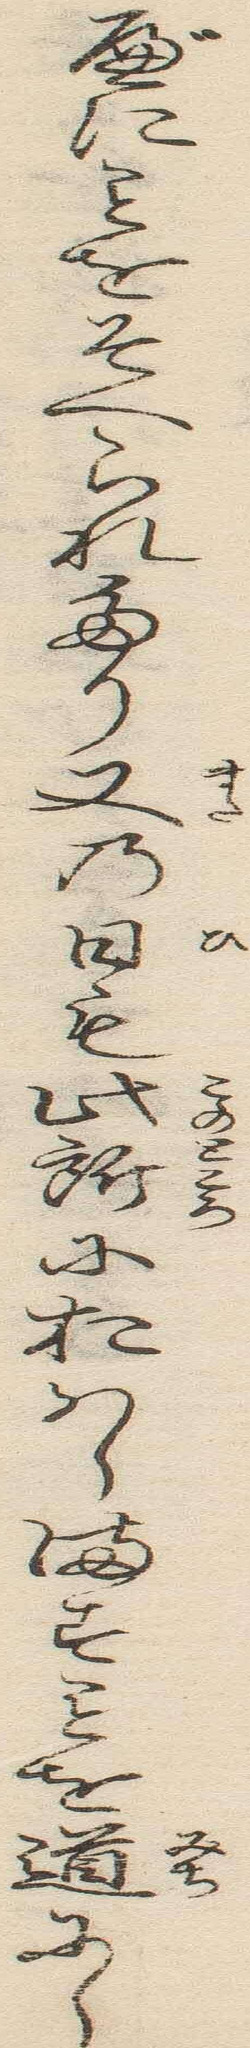べにことをそへられたり又の日も此所におはしますことを道にし
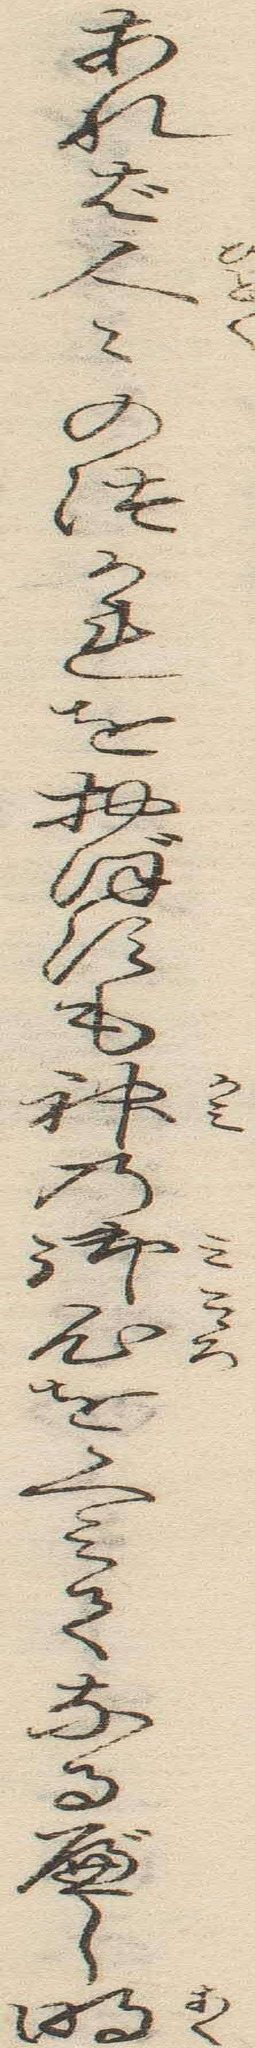あれば人〻のつかれをおぼすも神の御心をくみてなるべし明
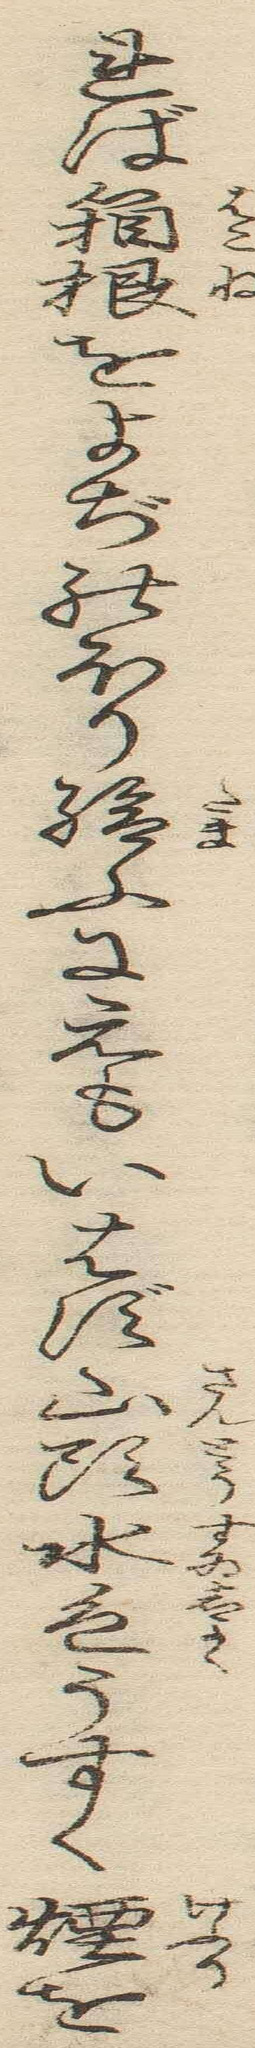れば箱根をよぢのほり給ふにえもいはず山頭水色うすく煙を

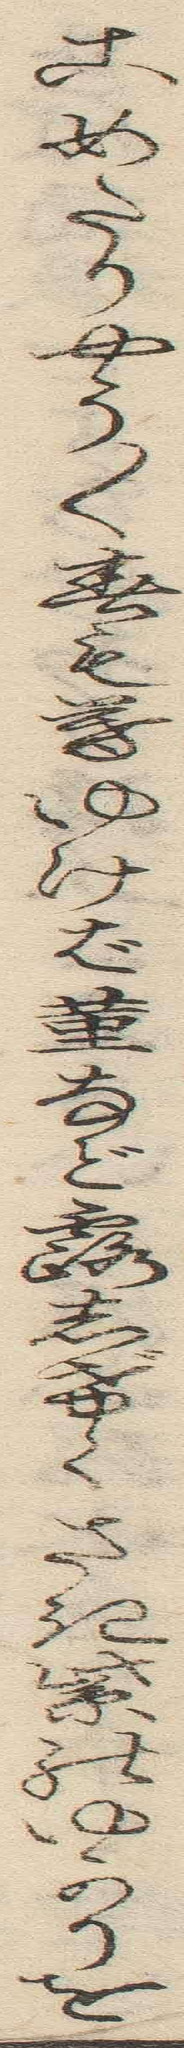こめたりやう〳〵春も暮ゆけば菫など露しげくさき紫のゆかりを
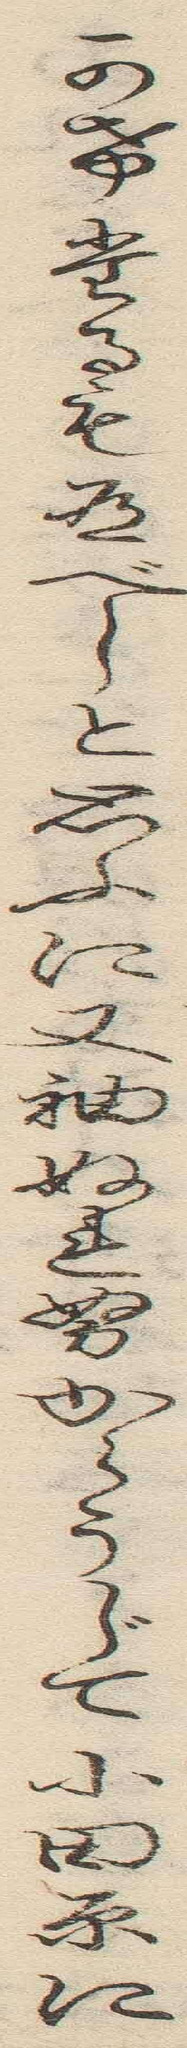かけたるも有るべしと思ふに又袖ぬれぬからうじて小田原に
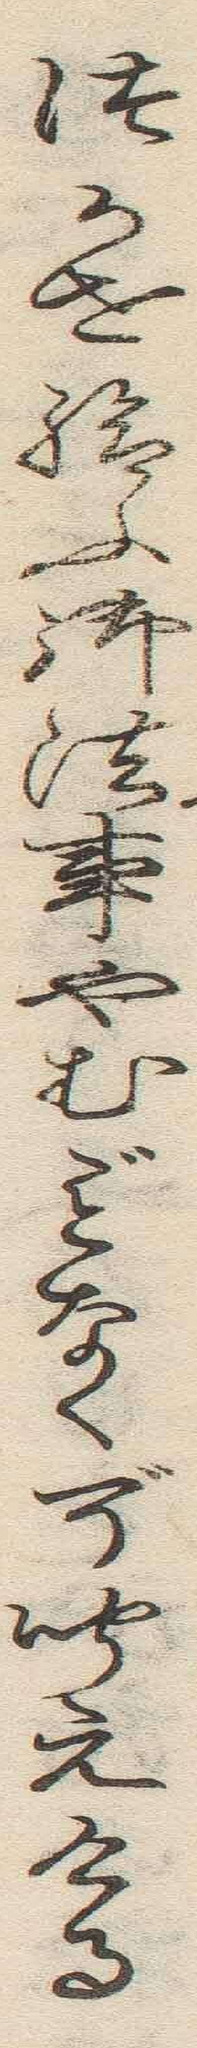つかせ給ふ御法事やむごとなくぞ聞えける
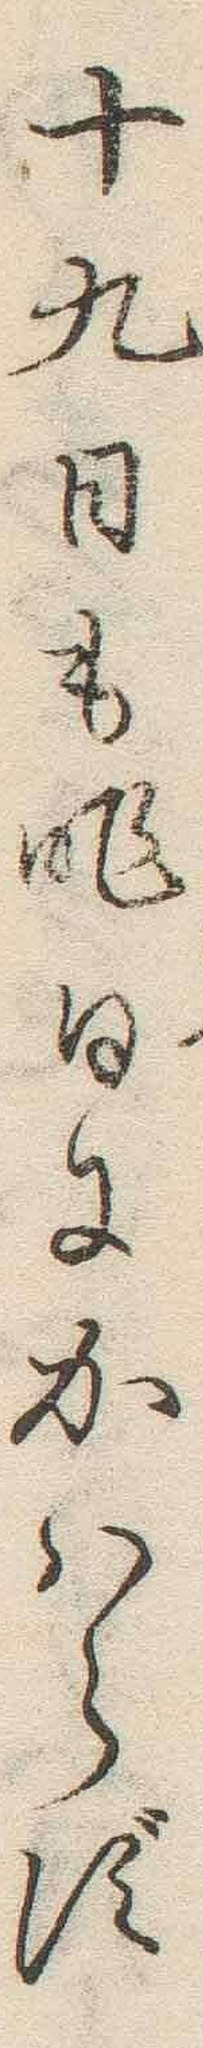十九日も昨日にかはらず
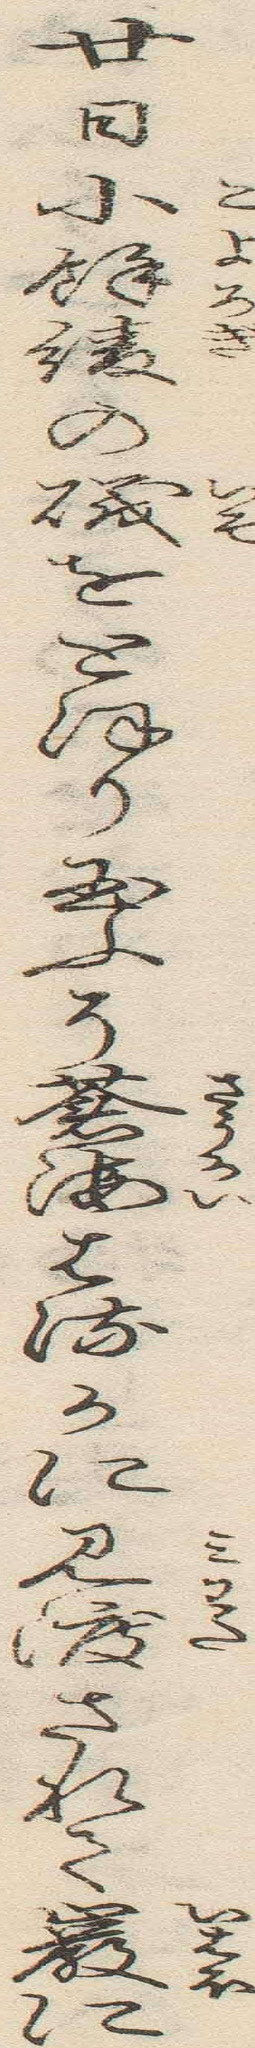廿日小餘綾の磯をとほり玉ふに蒼海はるかに見渡されて巖に
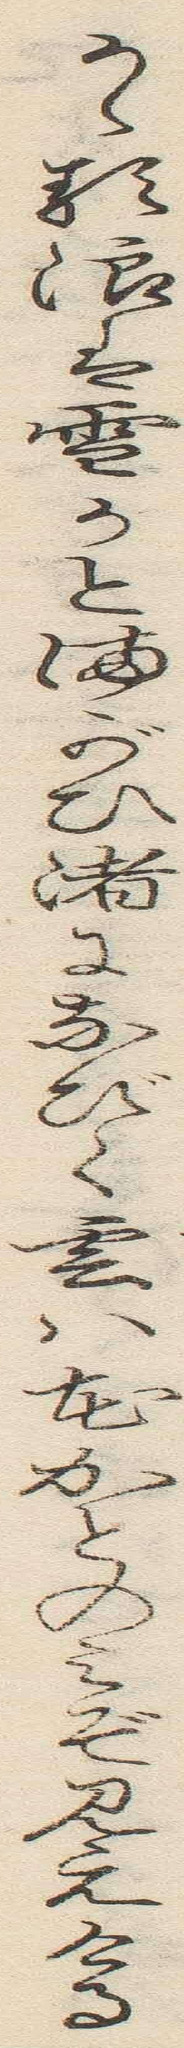かゝる浪は雪かとまがひ渚になびく雲は花かとのみぞ見えける
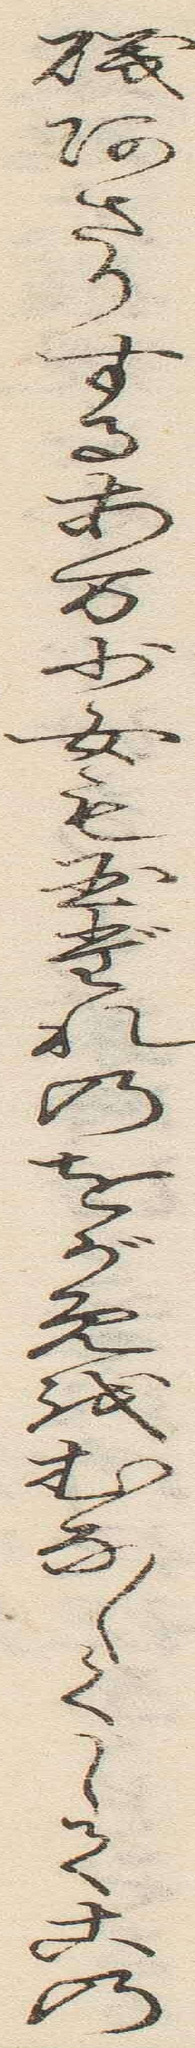磯あさりするあま少女も玉だれのをがめをむなしくしてこの
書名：日光山志
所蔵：東京学芸大学附属図書館 国文学研究資料館
